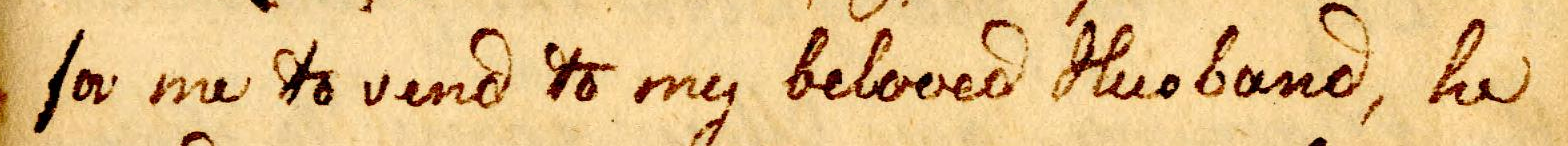for me to send to my beloved Husband, he
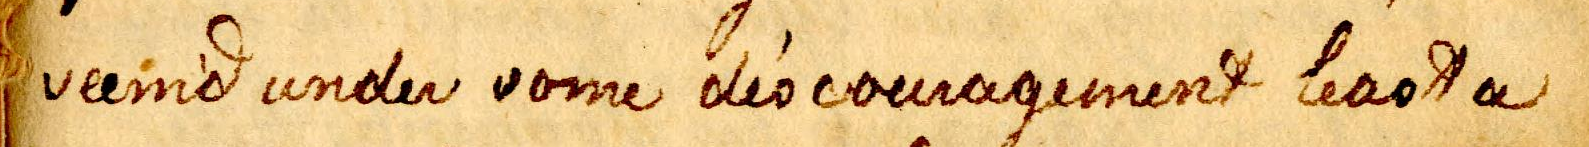seem'd under some discouragement least a
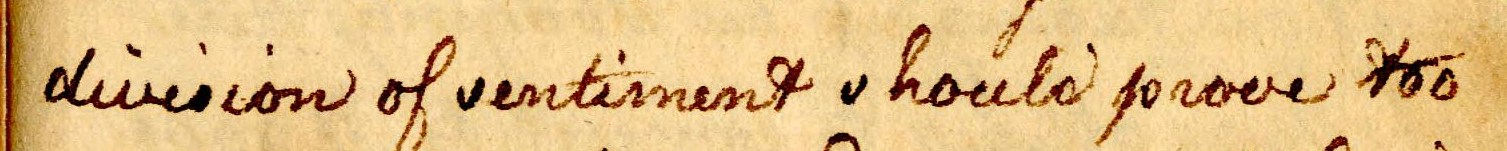division of sentiment should prove too
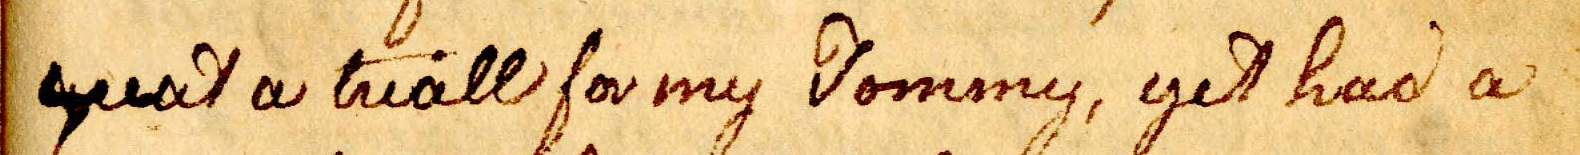great a triall for my Tommy, yet had a
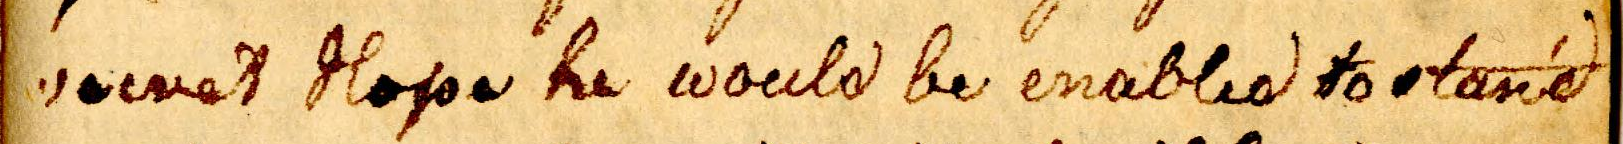secret Hope he would be enabled to stand
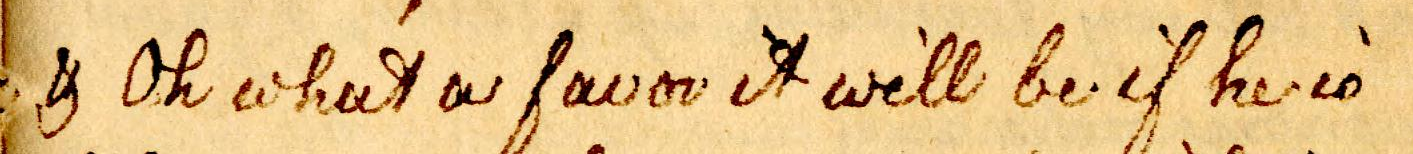& Oh what a favor it will be if he is
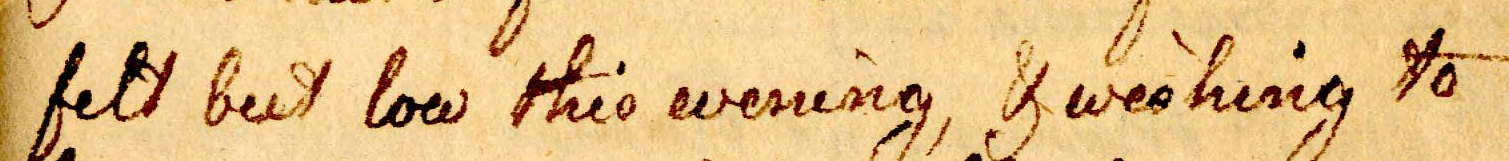felt but low this evening, & wishing to
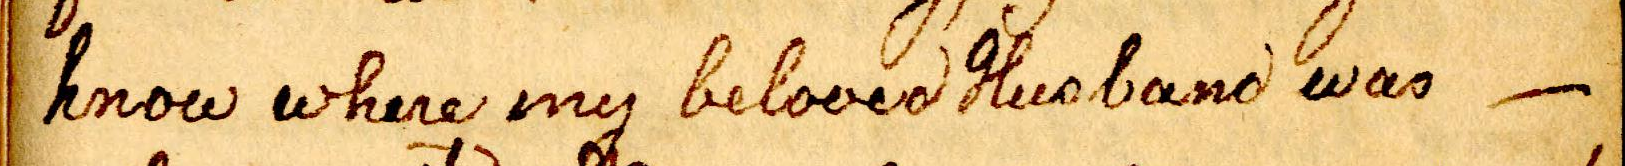know where my beloved Husband was-
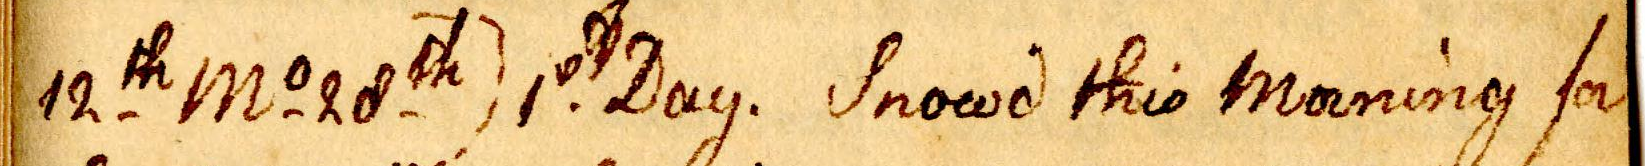12^th M^o 28^th) 1^st Day. Snowd this Morning for
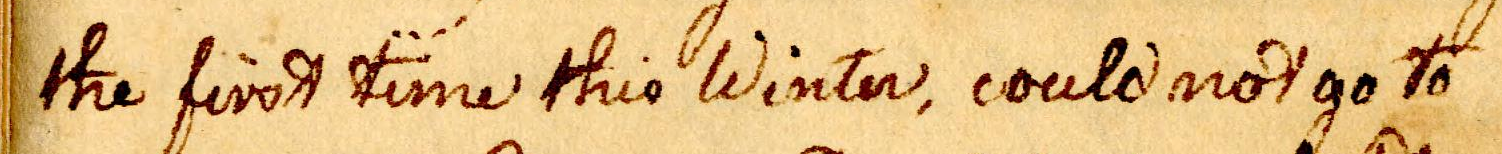the first time this Winter, could not go to
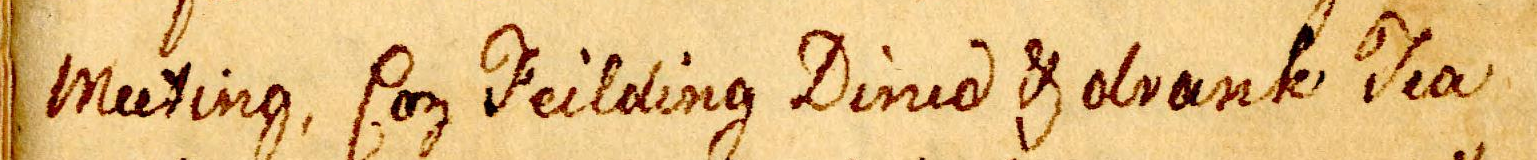Meeting, Coz Feilding Dined & drank Tea
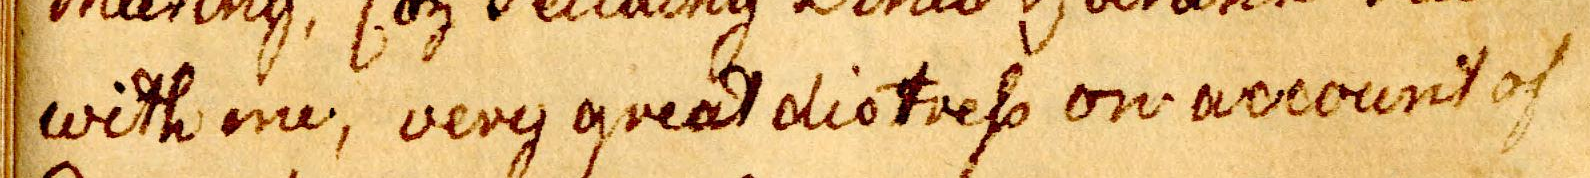with me, very great distress on account of
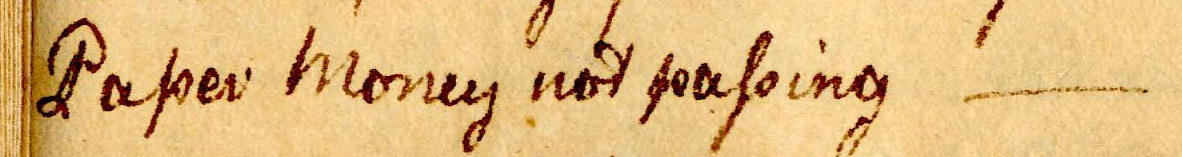Paper Money not passing-
